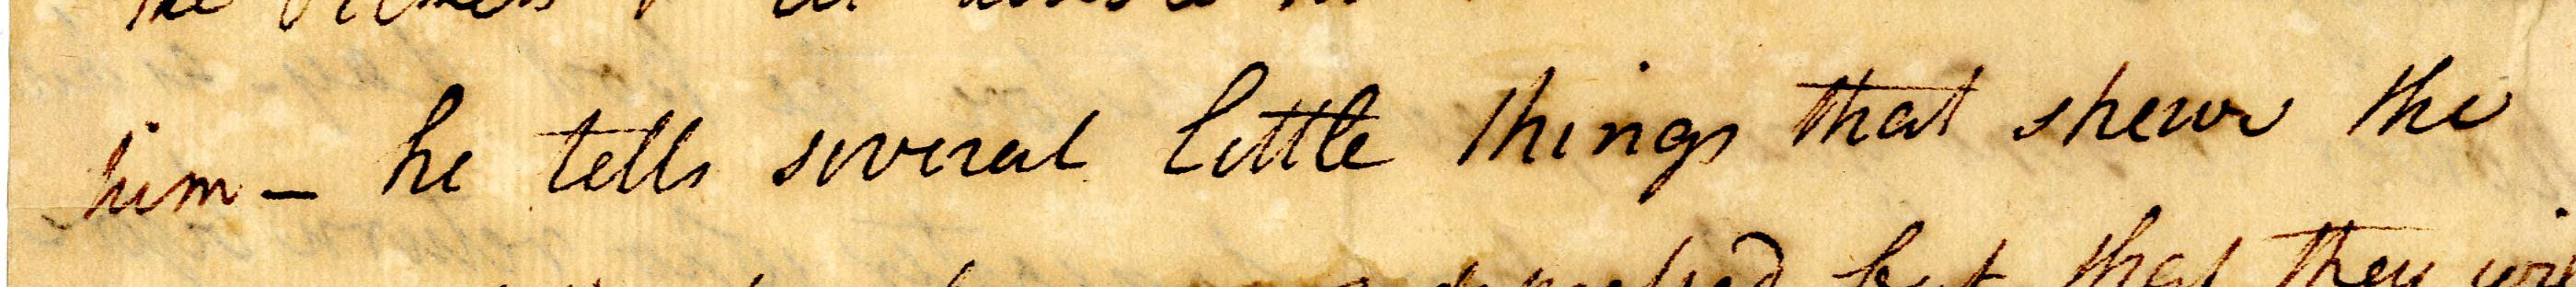him- he tells several little things that shewe the
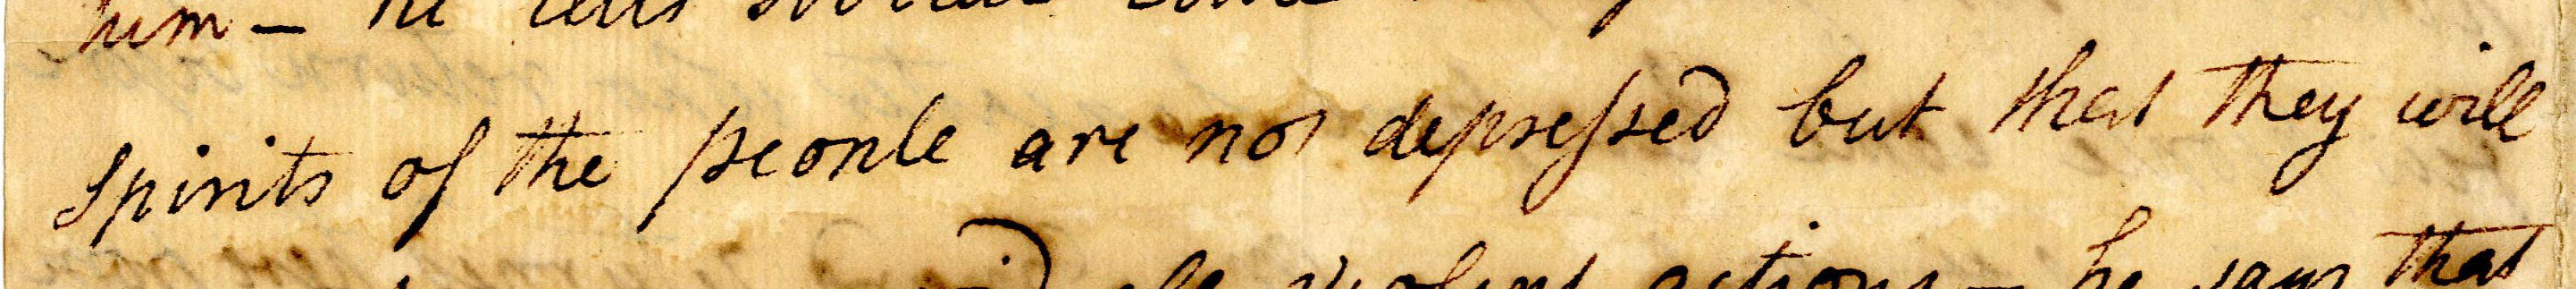spirits of the people are not depressed but that they will
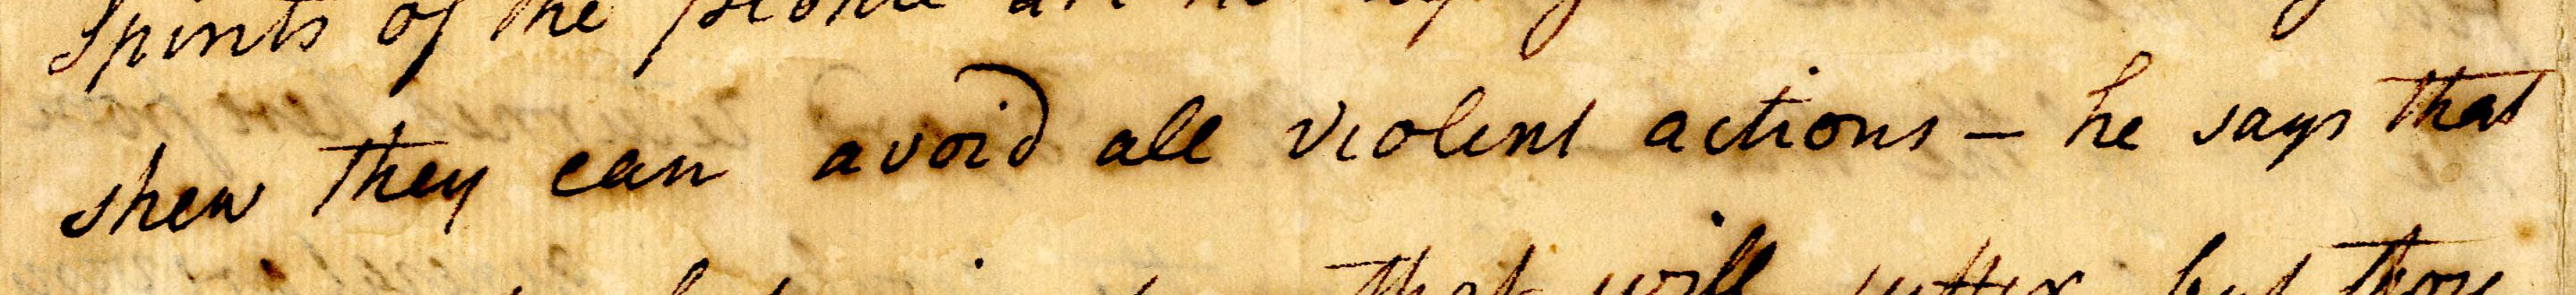shew they can avoid all violent actions- he says that
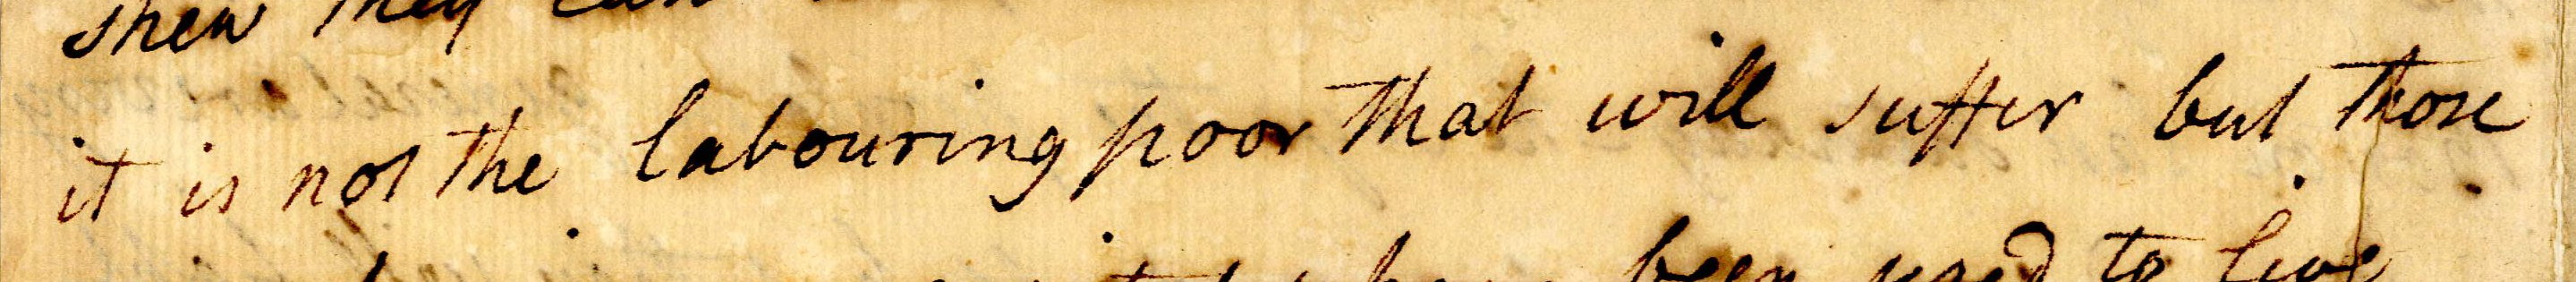it is not the labouring poor that will suffer but those
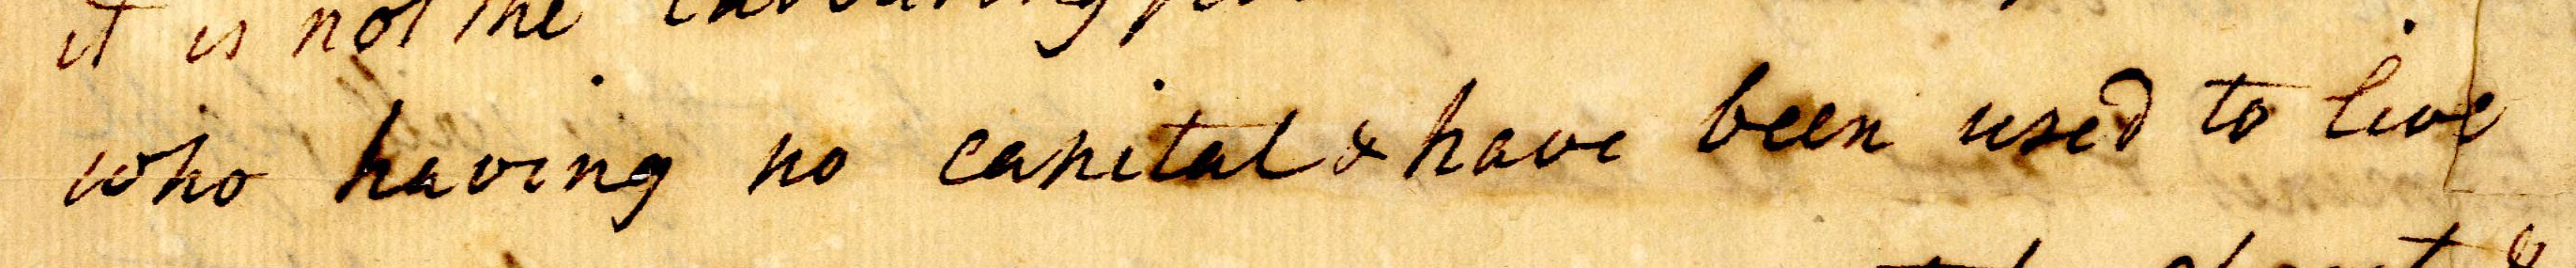who having no capital & have been used to live
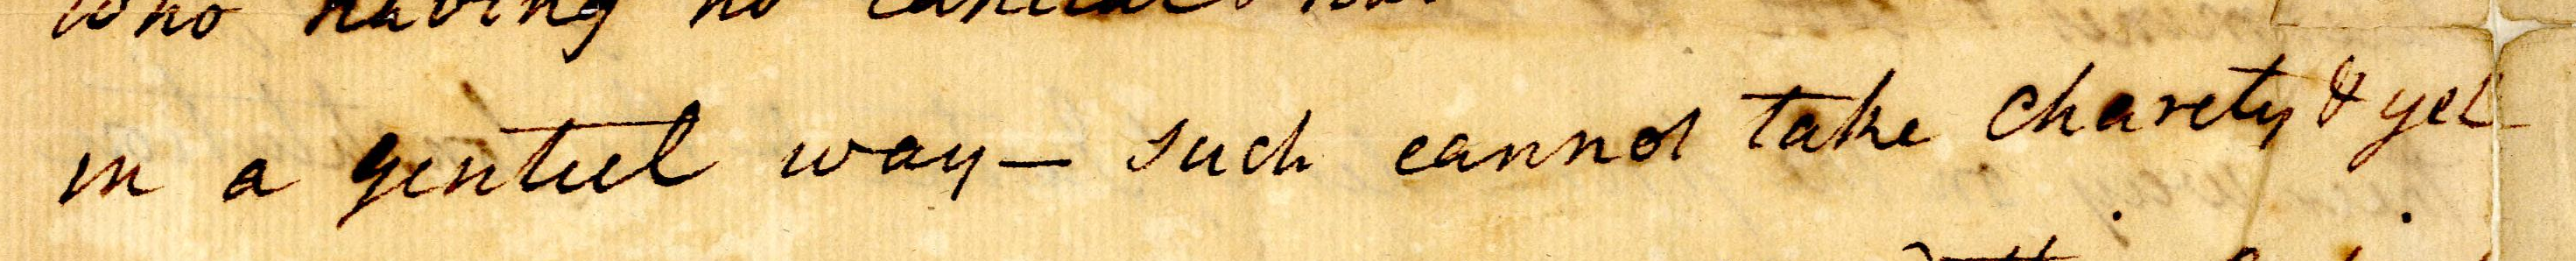in a genteel way- such cannot take charity & yet
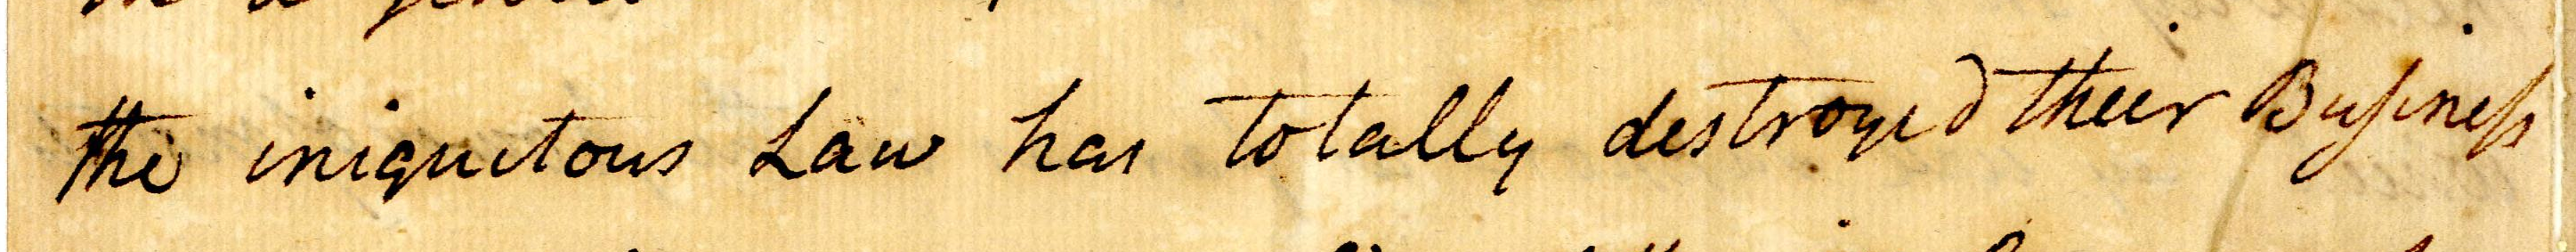the iniquitous Law has totally destroyed their Business
